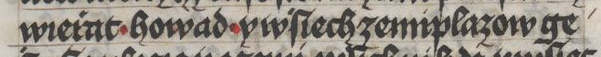wieṙat.howad.y wẛiech zemiplazow ge¬
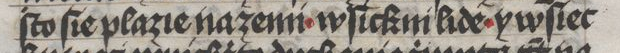ẛto ſie plazie na zemí.wẛickni lide.y wſiec¬
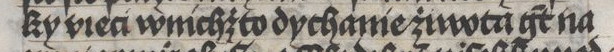ky vieci wnichżto dychaníe żiwota ḡt na
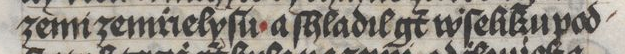zemi zemṙielyſu.a ſhladil ḡt wẛeliku pod¬
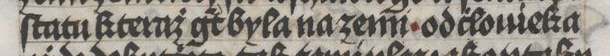ſtatu kteraż ḡt byla na zemi.odċlouieka
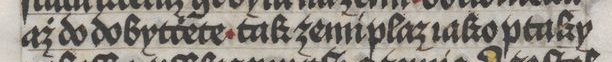aż do dobytċete.tak zemi plaz iako ptaky
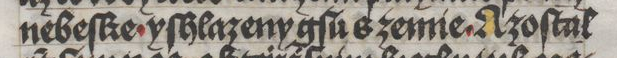nebeſke.y ſhlazeny gſu s zemie.A zoſtal
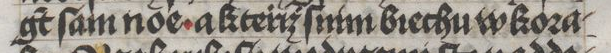ḡt ſam noe.a kteṙiż ſnim bíechu w kora¬
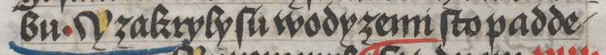bu.Y zakryly ſu wody zemí ſto padde¬
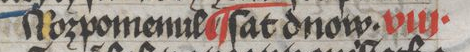Rozpomenul ſat dnow.viij.
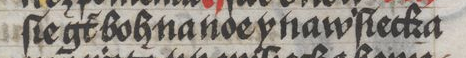ſie ḡt boh na noe y nawẛiecka
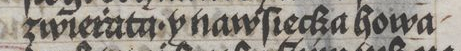zwieṙata.y nawẛiecka howa¬
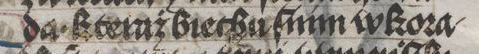da.kteraż biecbu ſním wkora¬
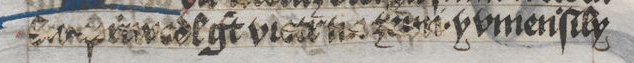.C.ue.rbwedl ḡt viecd myzxeni.y vnienẛily.
